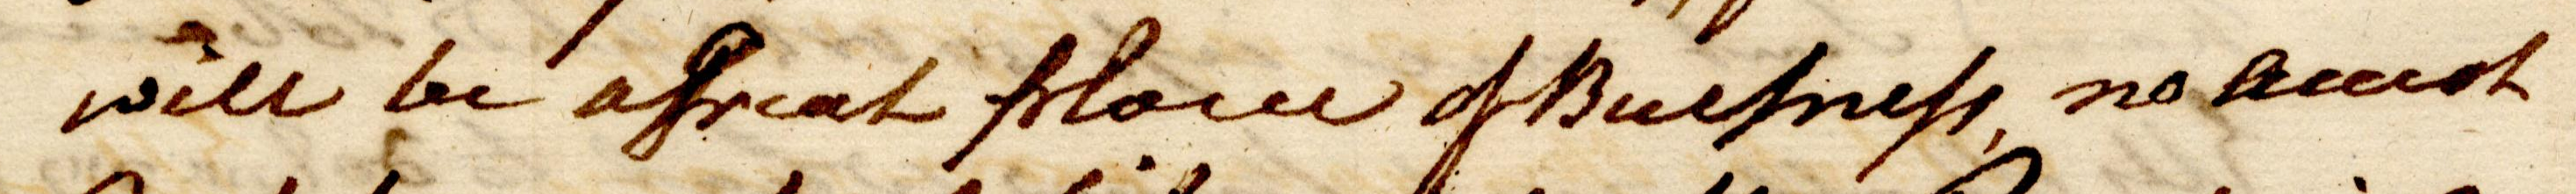will be a great place of Buisness, no acco^t
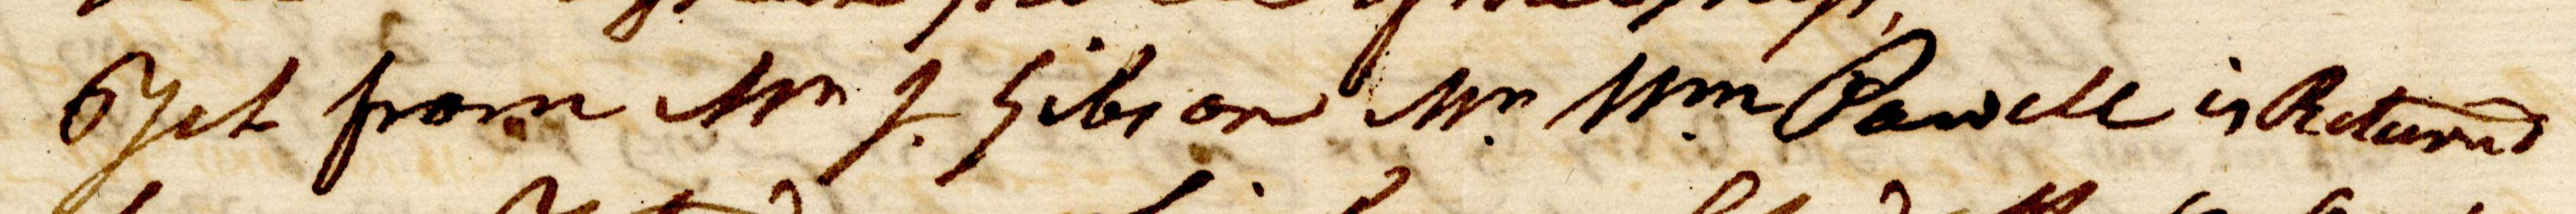yet from M^r J Gibson M^r W^m Powell is Returned
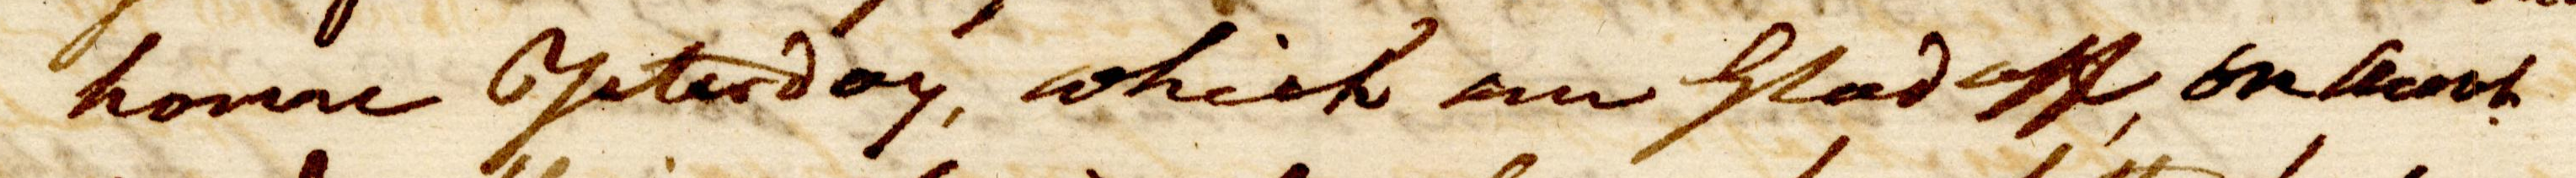home yesterday, which am Glad off, on acco^t
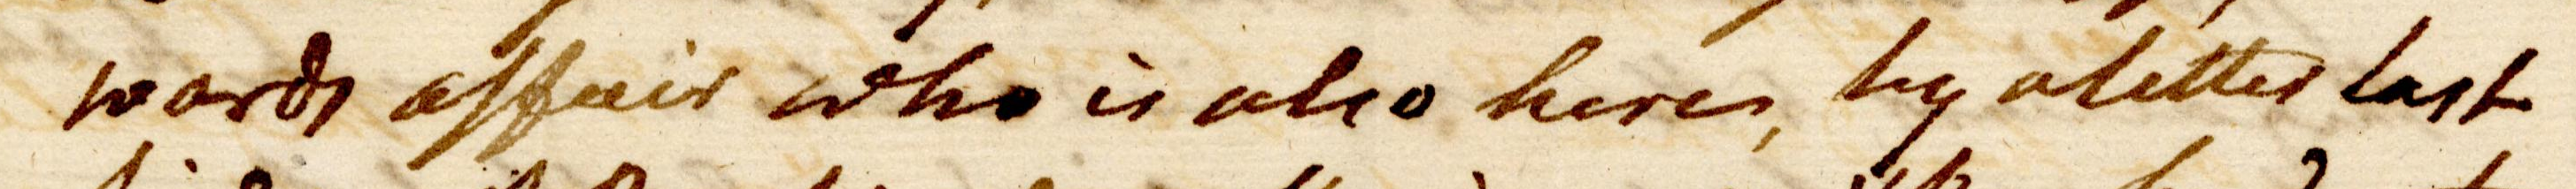words affair who is also here by a letter last
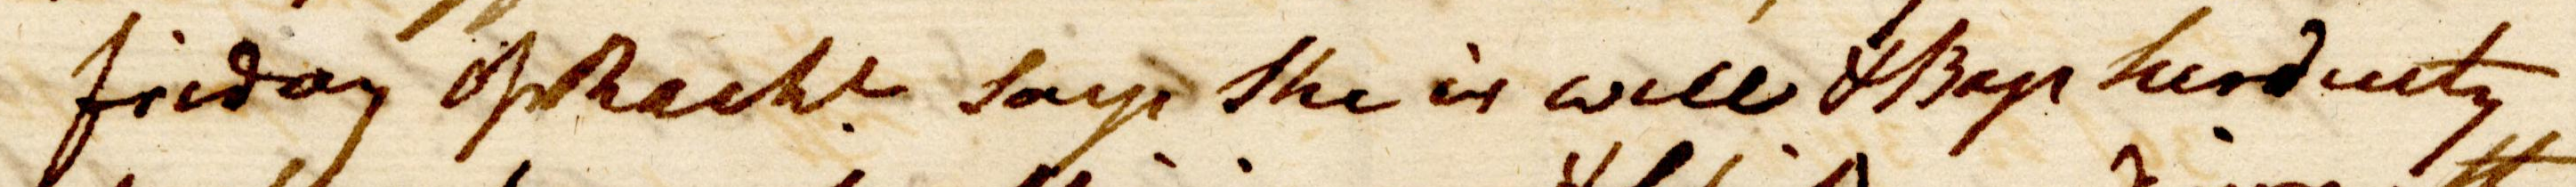friday of which says she is well & Begs her duty
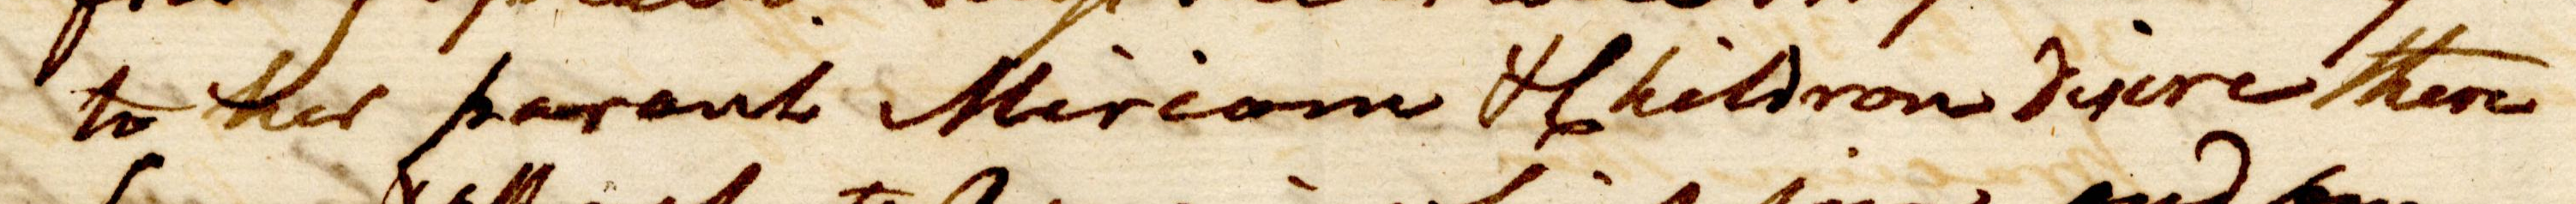to her parents Miriam & Children desire there
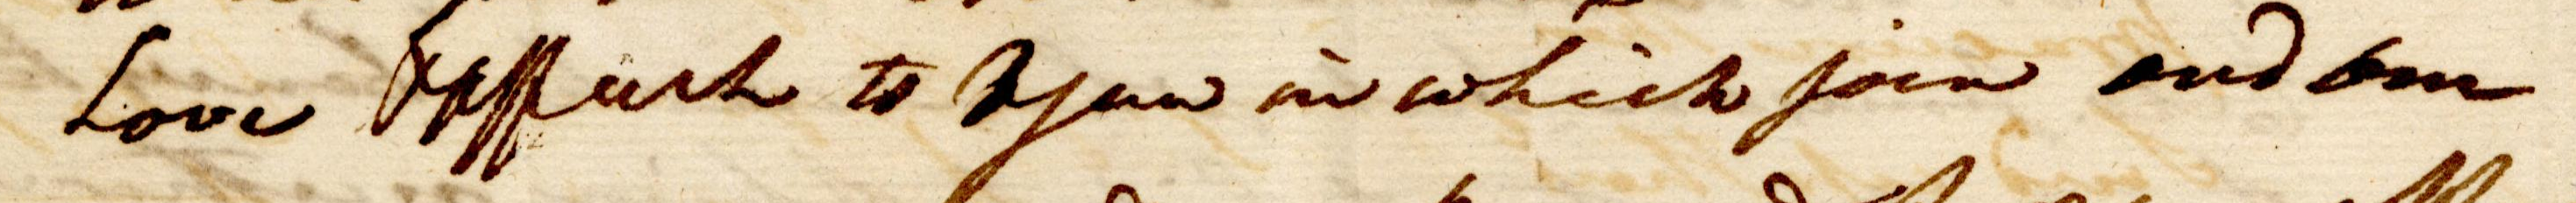love & Affect to you in which join and care
